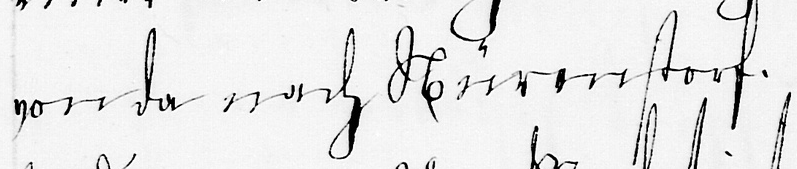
von da nach Nürenstorf.
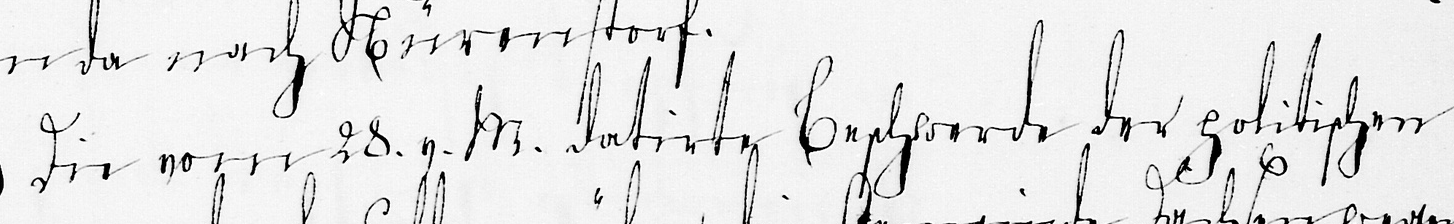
Die vom 28. v. M. datirte Beschwerde der politischen
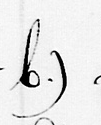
b.)
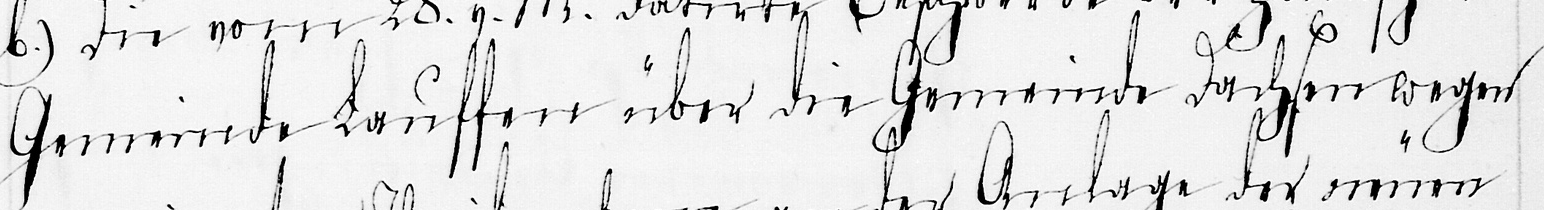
Gemeinde Lauffen über die Gemeinde Dachsen wegen
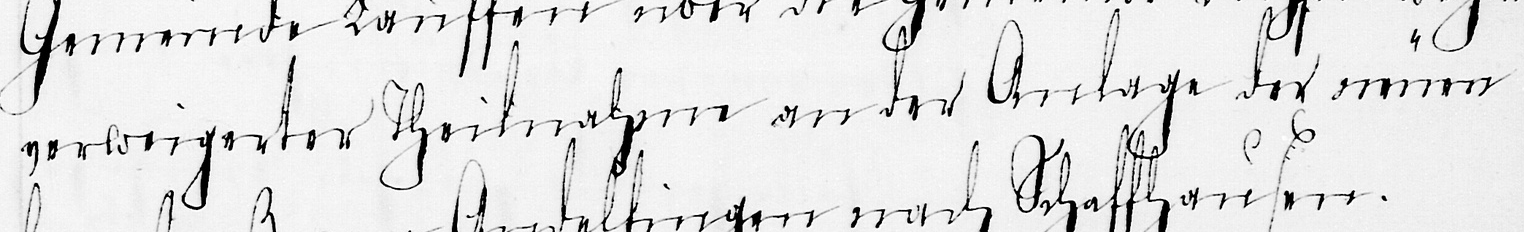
verweigerter Theilnahme an der Anlage der neuen
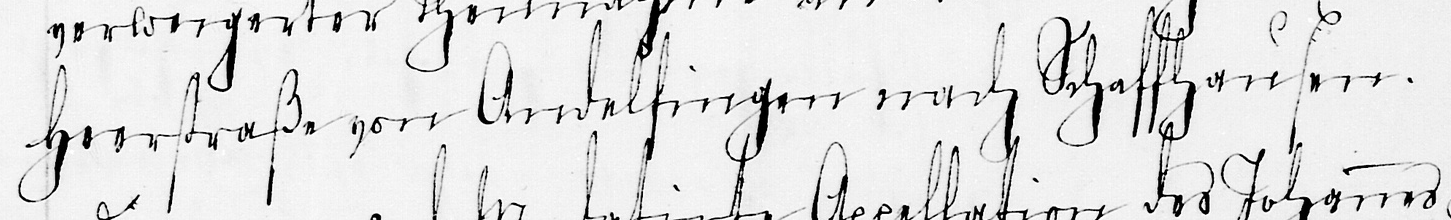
Heerstraße von Andelfingen nach Schaffhausen.
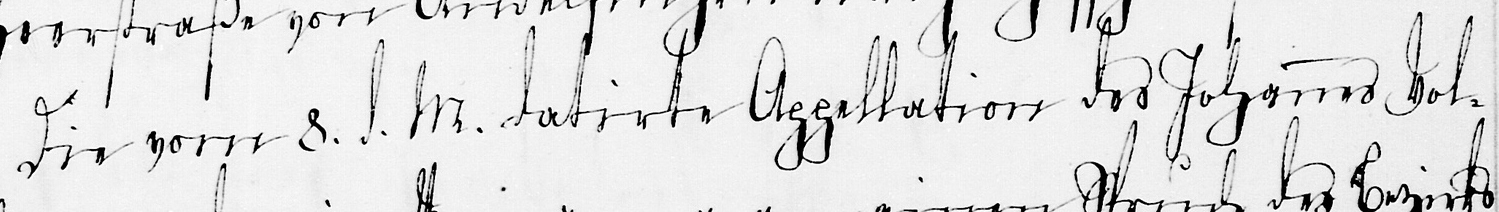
Die vom 8. d. M. datirte Appellation des Johannes Vol¬
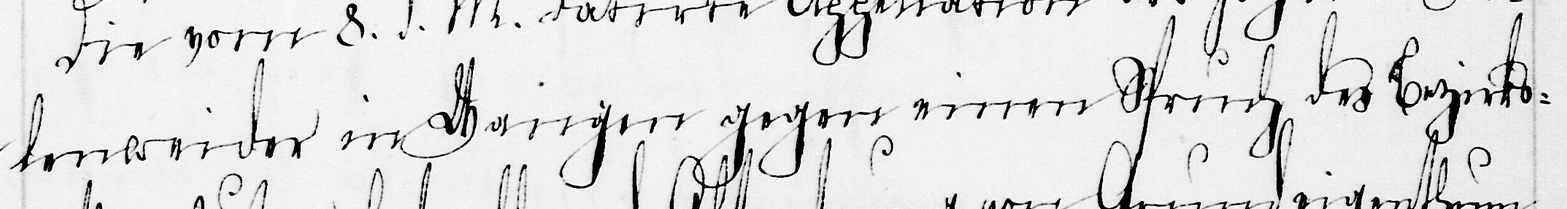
lenweider in Wangen gegen einen Spruch des Bezirks¬
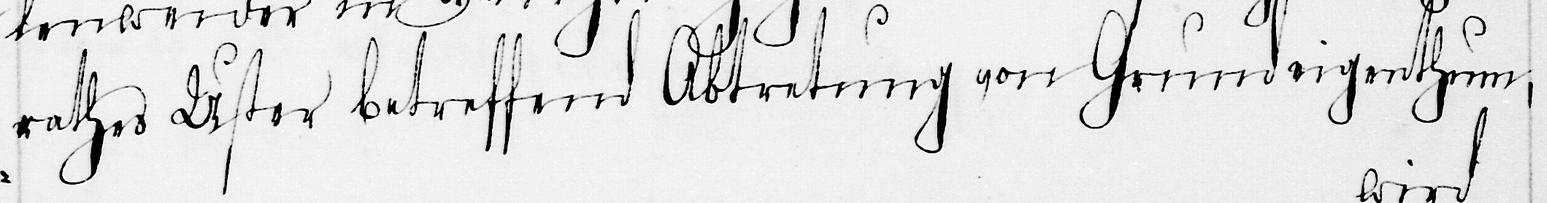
rathes Uster betreffend Abtretung von Grundeigenthum,
